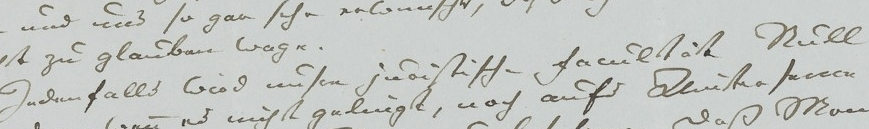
Jedenfalls wird unsre juristische Facultät Null
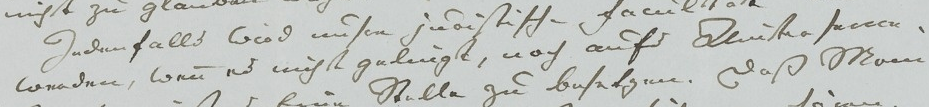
werden, wenn es nicht gelingt, noch aufs Winterseme-
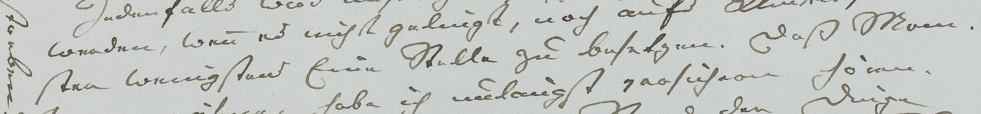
ster wenigstens Eine Stelle zu besetzen. Daß Mom-
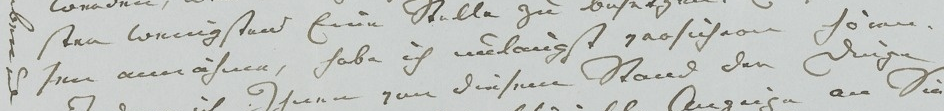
sen annäme, habe ich unlängst versichern hören.
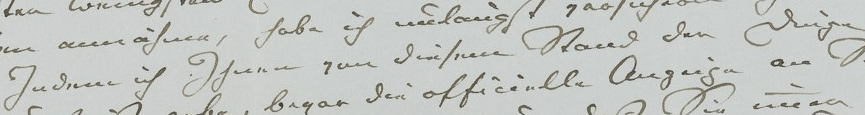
Indem ich Ihnen von diesem Stand der Dinge
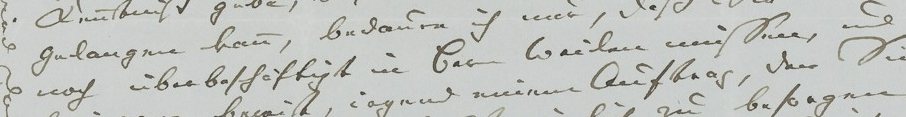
noch überbeschäftigt in Bern weilen müssen, und
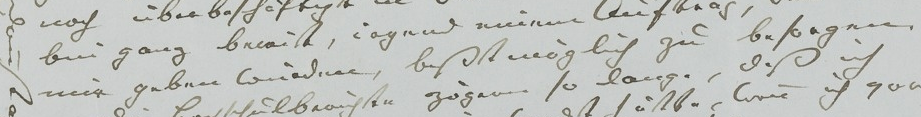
mir geben würden, beßtmöglich zu besorgen.
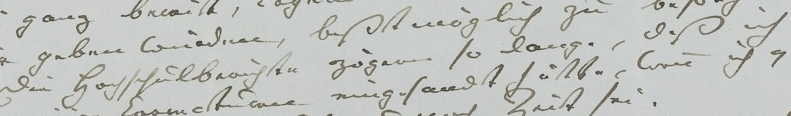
Die Hochschulberichte zögern so lange, daß ich
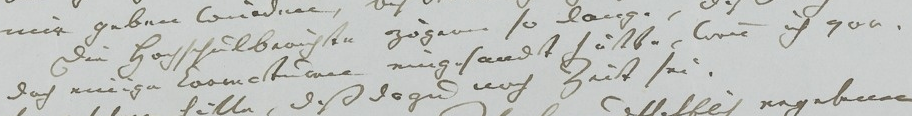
doch einige Correcturen eingesandt hätte, wenn ich vor-
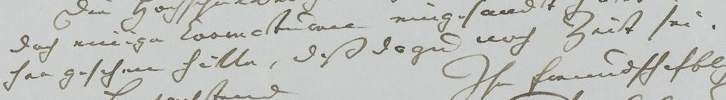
her gesehen hätte, daß dazu noch Zeit sei.
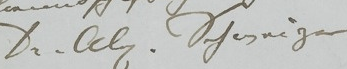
Dr. Alex. Schweizer
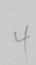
ist
